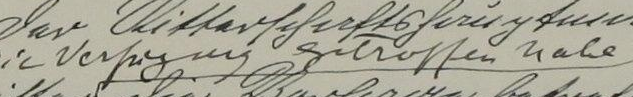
die Verfügung getroffen habe
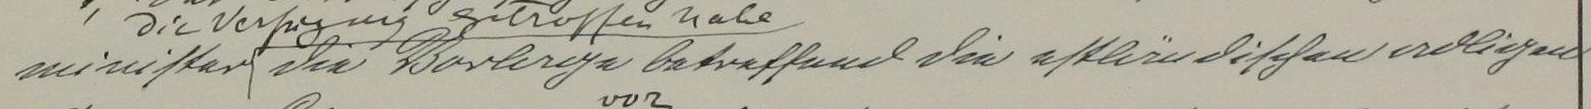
minister die Vorlage betreffend die estländischen adligen
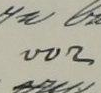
vor
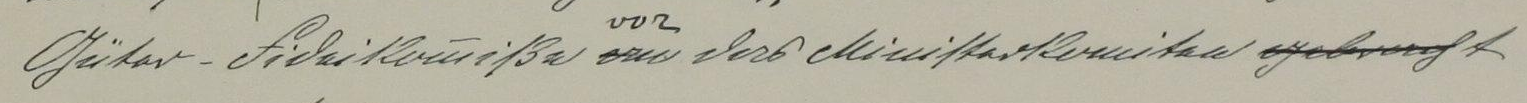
Güter-Fideikommiße an das Ministerkomitee gebracht
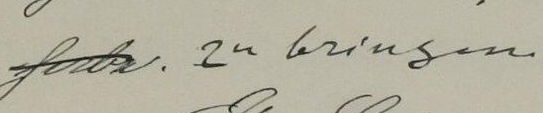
habe. zu bringen.
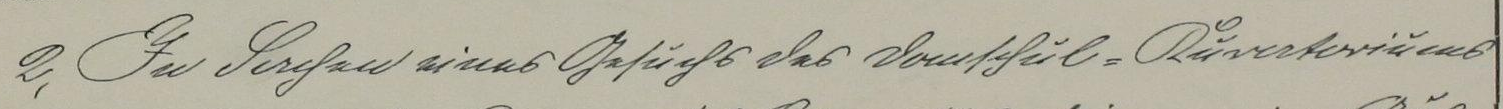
2. In Sachen eines Gesuchs des Domschul-Kuratoriums
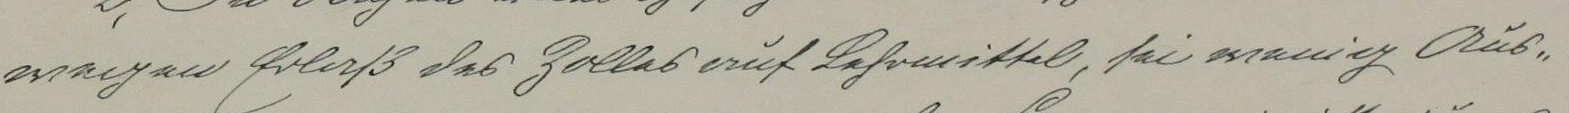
wegen Erlaß des Zolles auf Lehrmittel, sei wenig Aus-
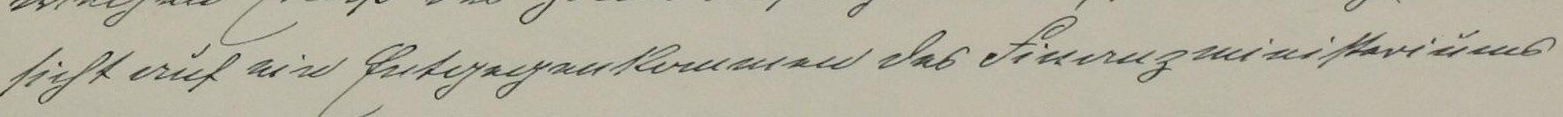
sicht auf ein Entgegenkommen des Finanzministeriums
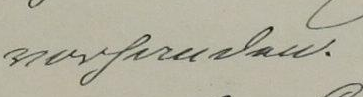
vorhanden.
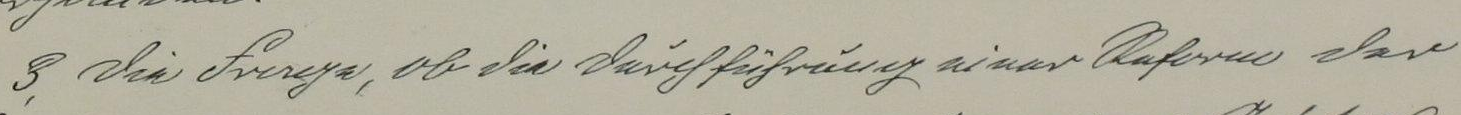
3. Die Frage, ob die Durchführung einer Reform der
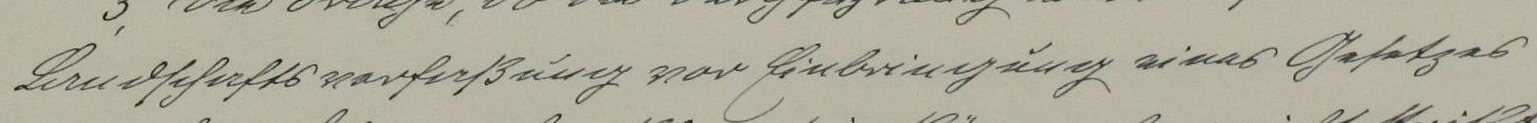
Landschaftsverfaßung vor Einbringung eines Gesetzes
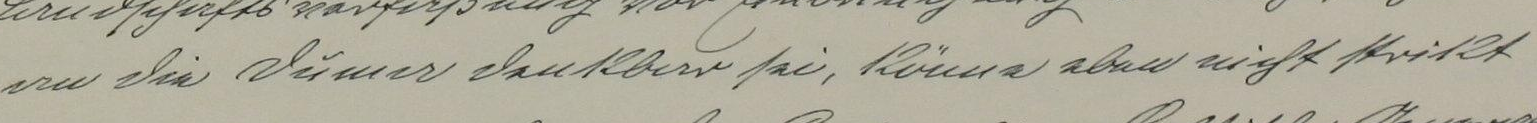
an die Duma denkbar sei, könne eben nicht strikt
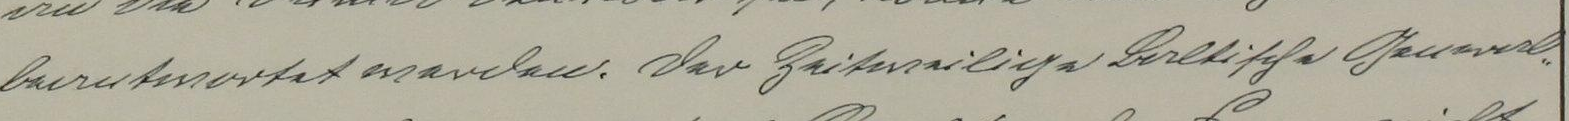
beantwortet werden. Der Zeitweilige Baltische General-
